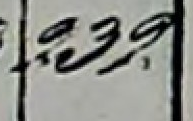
232
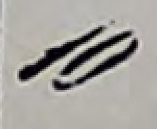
10
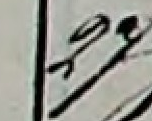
27
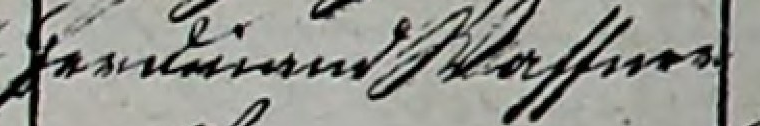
Ferdinand Wassner
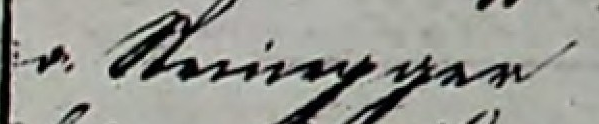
v. Steinegger
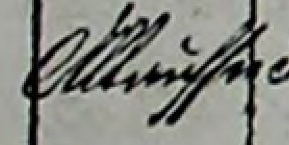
Altaussee
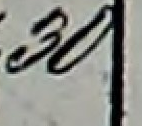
30
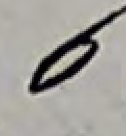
6
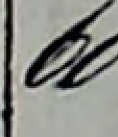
60
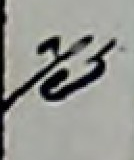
73
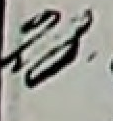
28
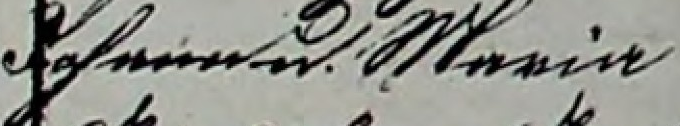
Johann u. Maria
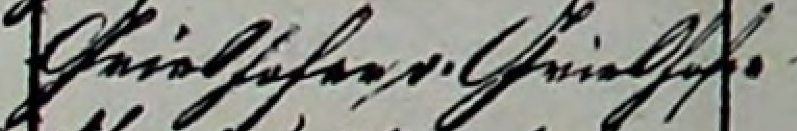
Grieshofer v. Grieshofer
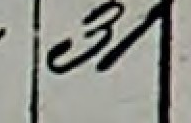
31
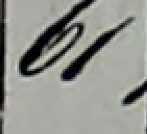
61
